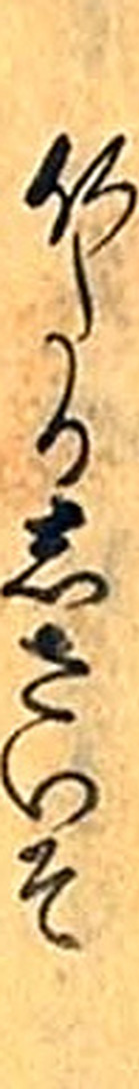何たるしさいそ
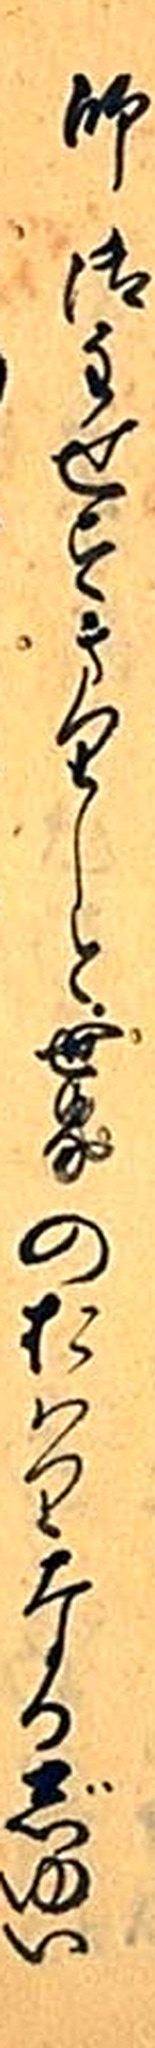師御主せすきりしと世界のおはりなるじゆい
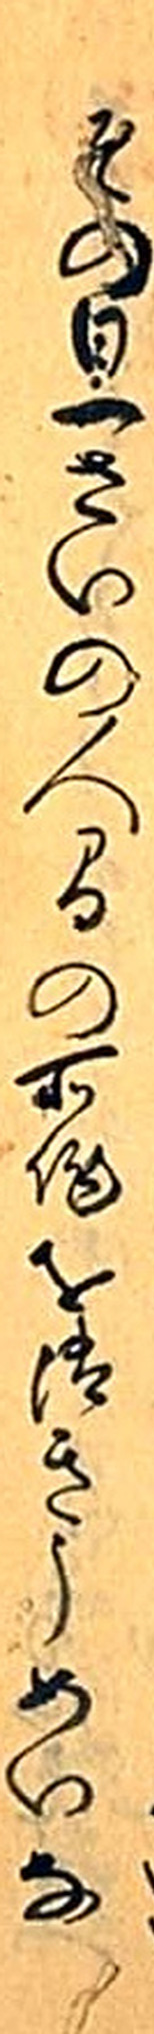その日一さいの人間の所作を御きうめいな
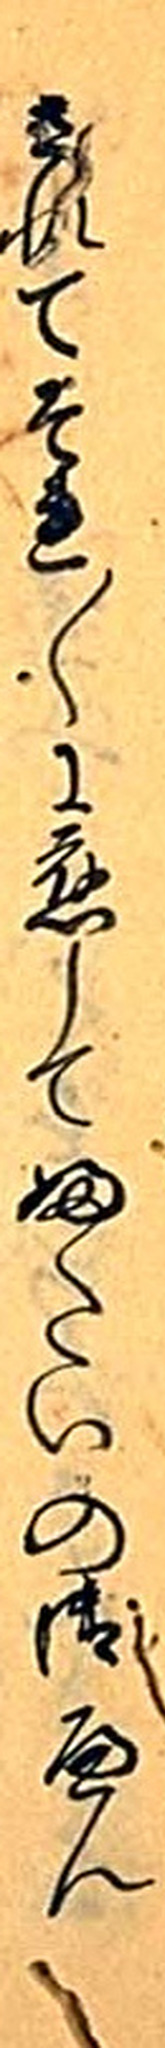されてそれ〳〵に応してふたいの御へん
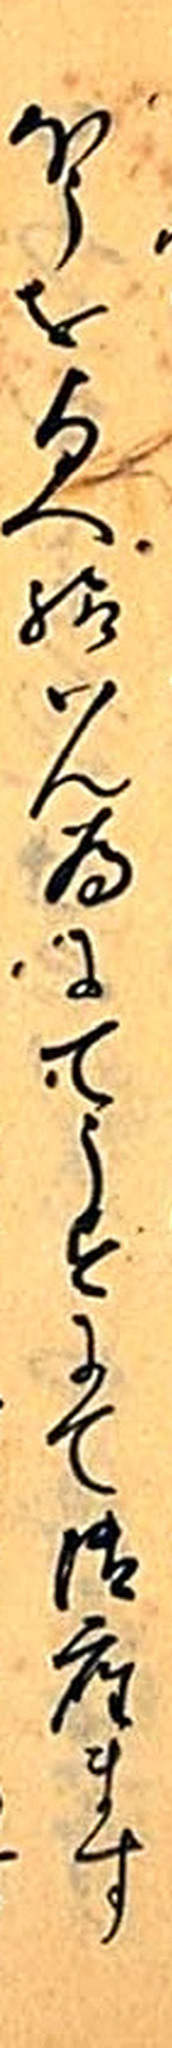ほうを与へ給はん為にてうすにて御座ます
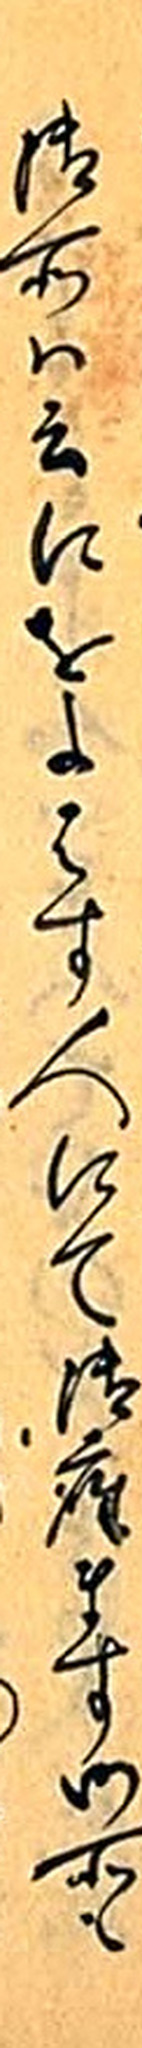御所は云にをよはす人にて御座ます御所も
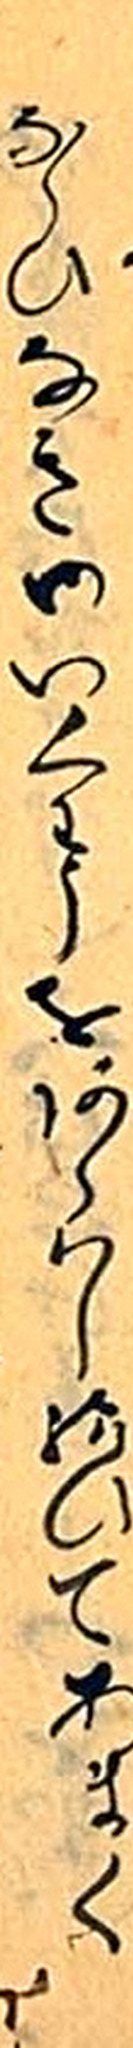ならひなき御いくわうをあらはし給ひてあまく
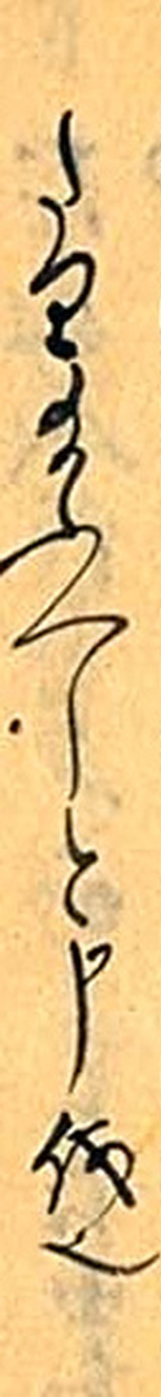たり給ふへしと申儀也
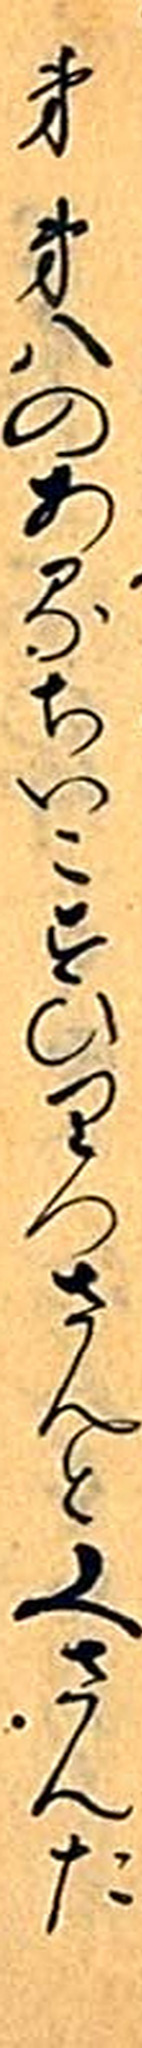弟第八のあるちいこすひりつさんと又さんた
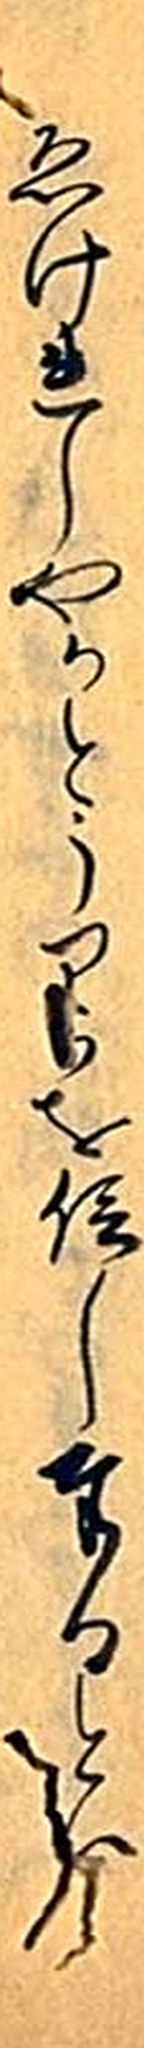ゑけれしやかとうりかを信し奉るとは
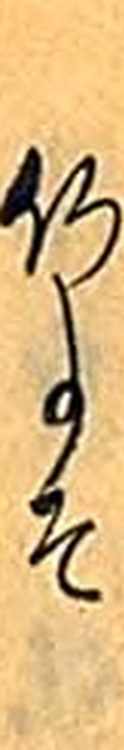何事そ
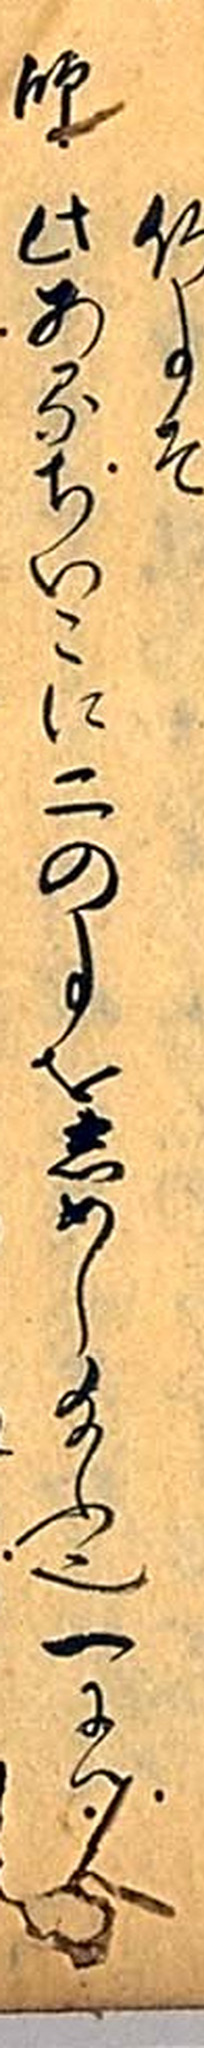師此あるちいこに二の事をしめし給ふ也一には
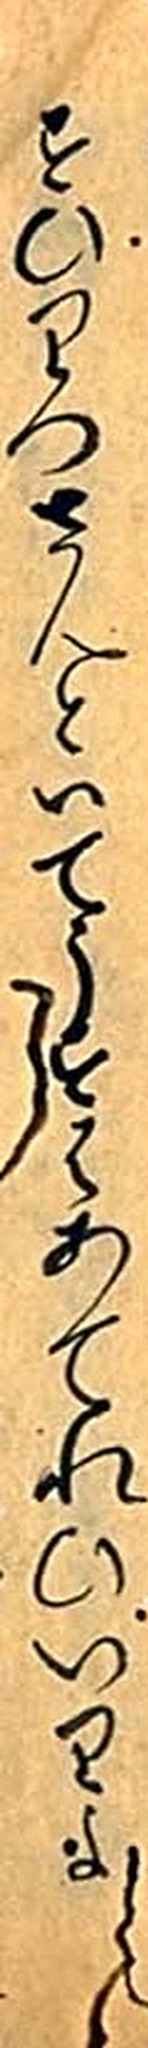すひりつさんとはてうすはあてれひいりよ
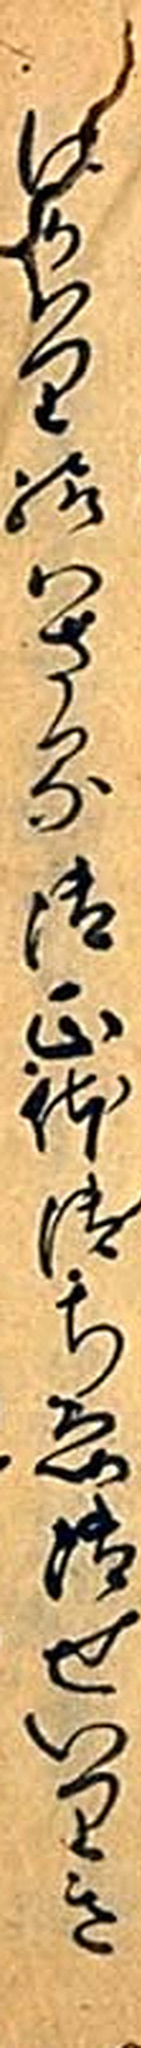にかはり給はさる御正体御ちゑ御せいりき
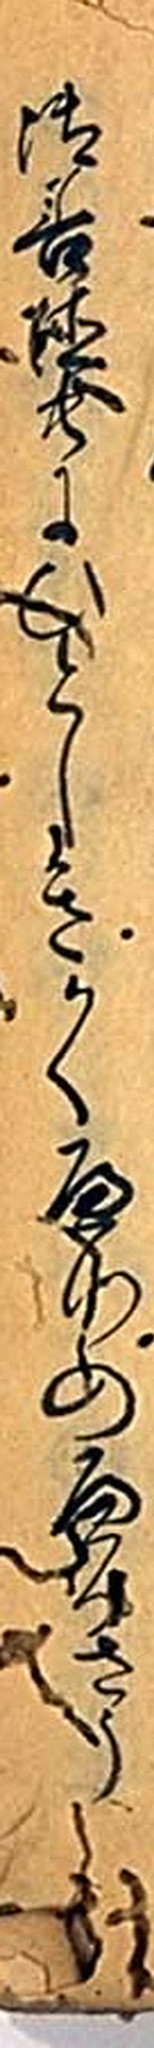御善徳共にひとしきかくへつのへるさう

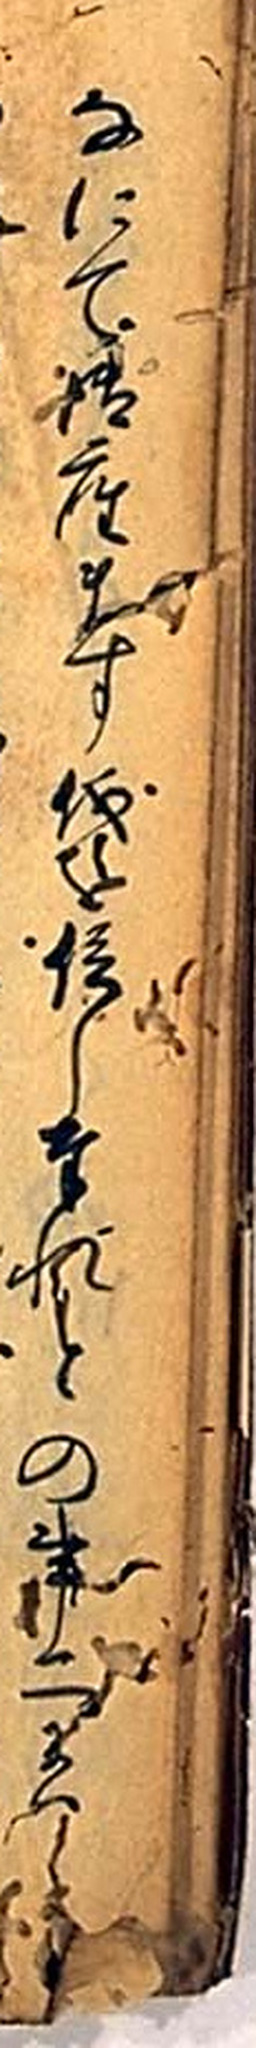なにて御座ます儀を信し奉れとの事二には
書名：ドチリナ・キリシタン
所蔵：東京大学総合図書館 / General Library in the University of Tokyo
